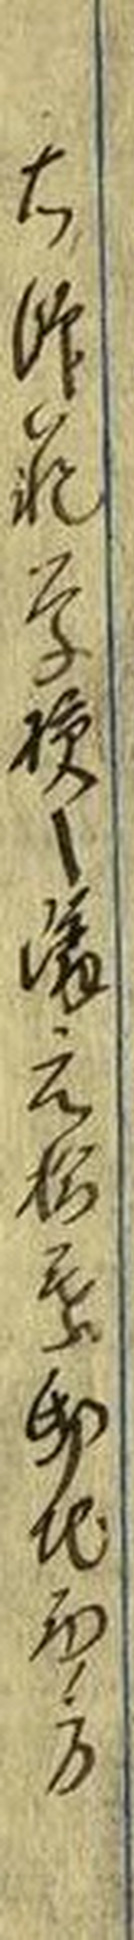右師範学校之隣元松葉邸北西の方
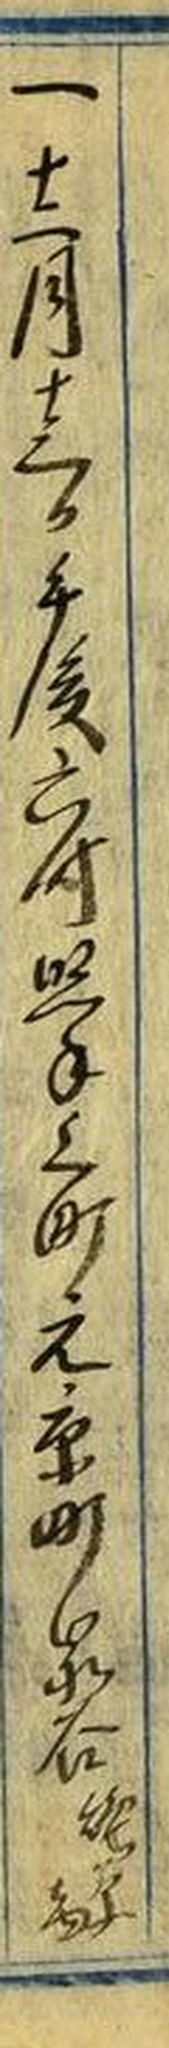一十二月十三日午後六時照手上町元京町泉谷煙草商
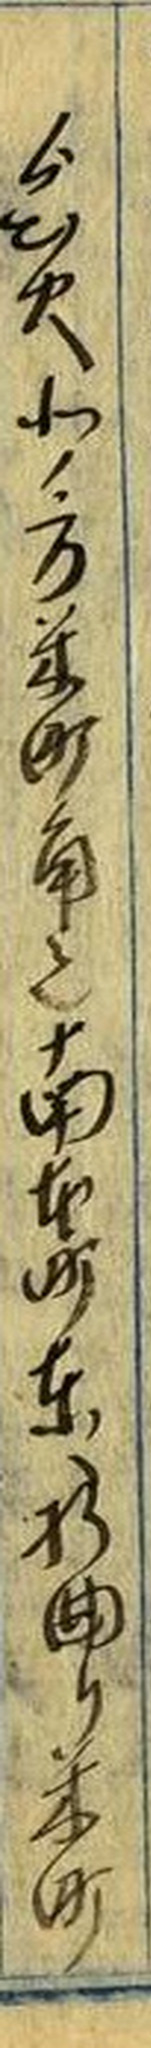ゟ出火北の方米町角迄南本町東へ折曲り米町
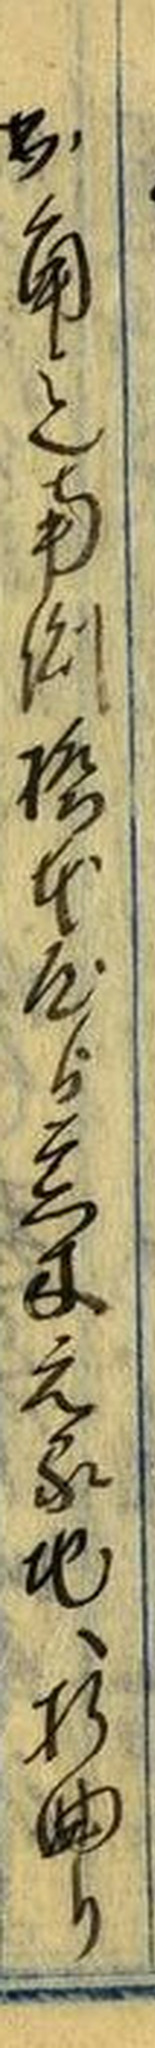出角迄南側橋本屋ゟ荒木元家北へ折曲り
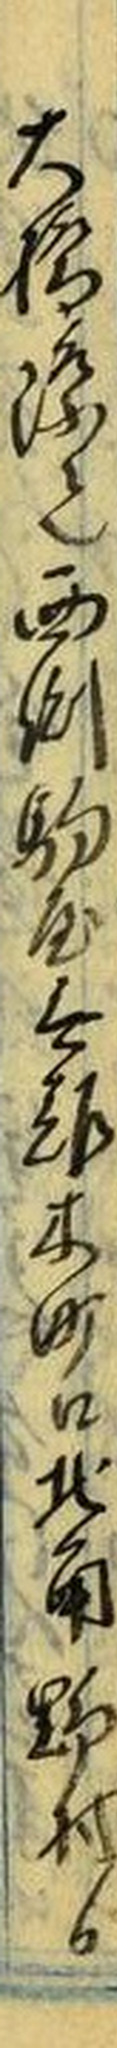大橋際迄西側駒屋無難木町口北角野村ゟ
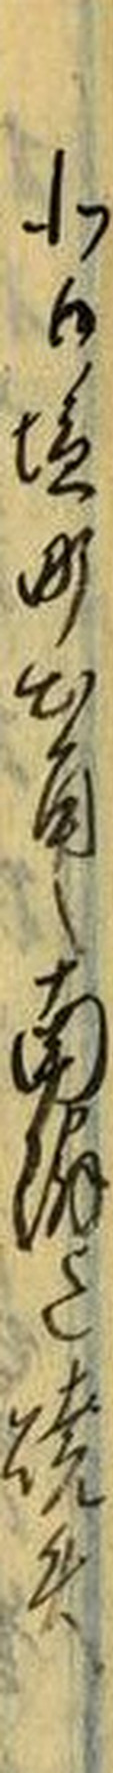北口境町出角之南隣迄焼失
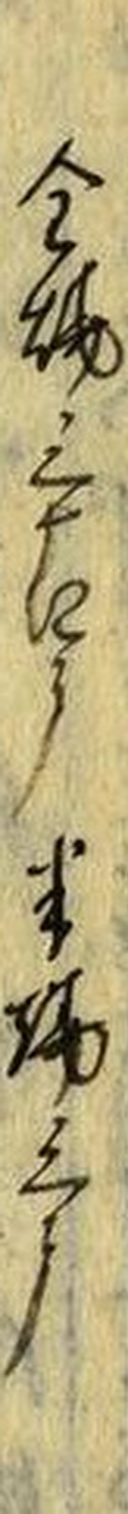全焼三十四戸半焼三戸
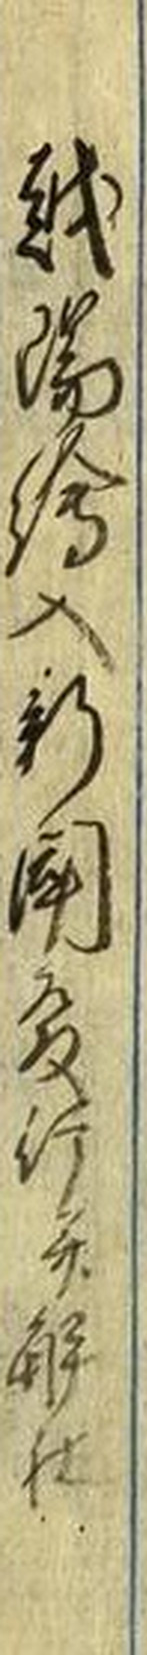越陽絵入新聞発行并解社
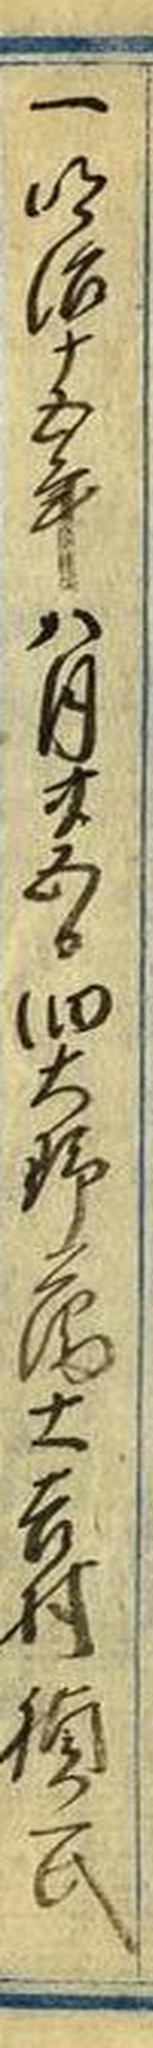一明治十五年八月廿五日旧大野藩士吉村貞一氏
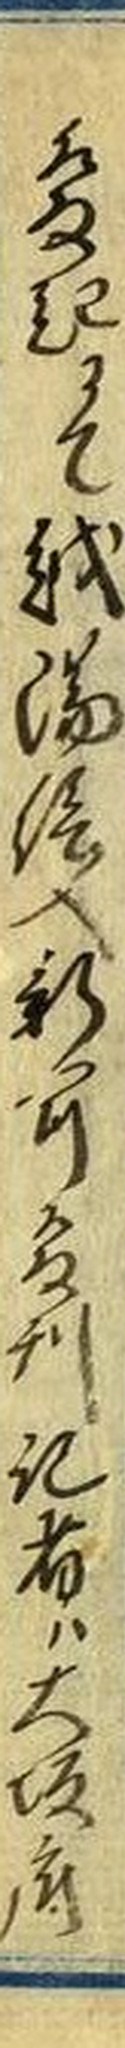発起にて越陽絵入新聞発刊記者は大阪府
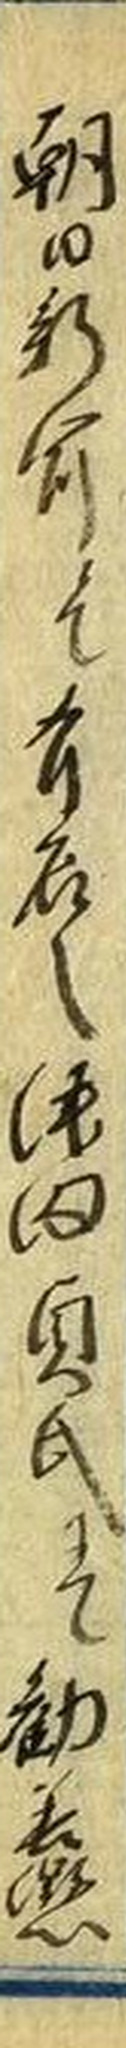朝日新聞にて有名之津田貞氏にて勧善懲
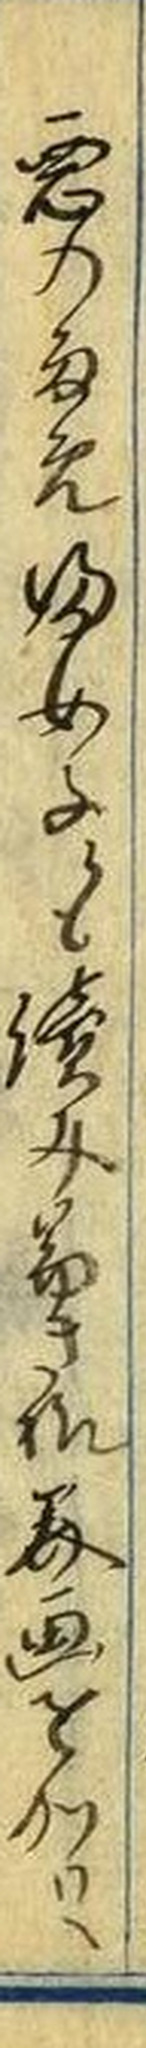悪のため婦女子にも読み易き様美画を加わへ
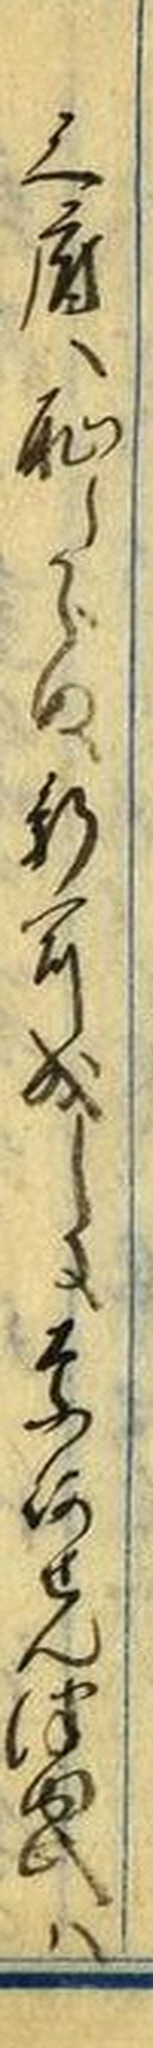三府へ恥しからぬ新聞成しに奈何せん津田氏は

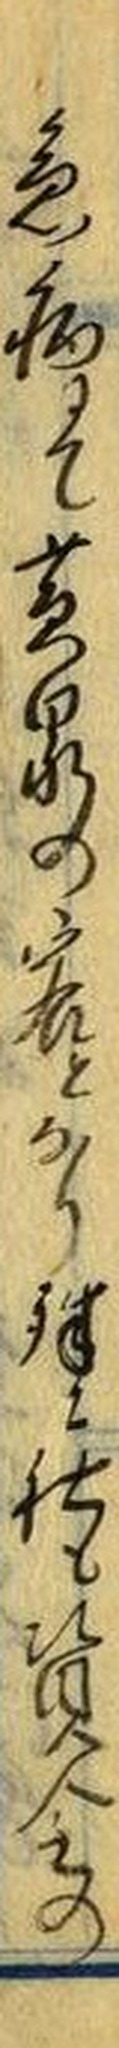急病にて黄泉の客となり殊に社も資金の
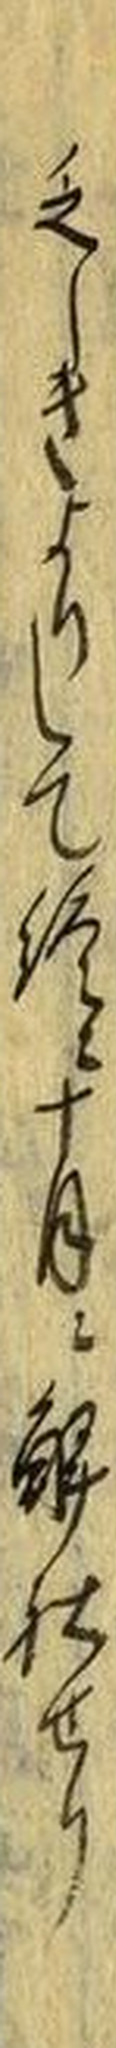乏しきよりして終に十月に解社せり
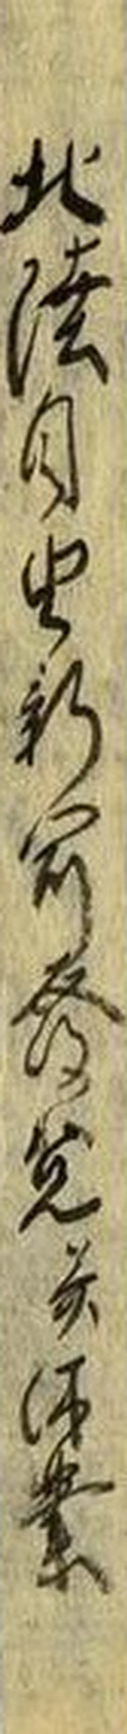北陸自由新聞発閲并休業
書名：温古集 五巻
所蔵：福井県文書館 Fukui Prefectural Archives
